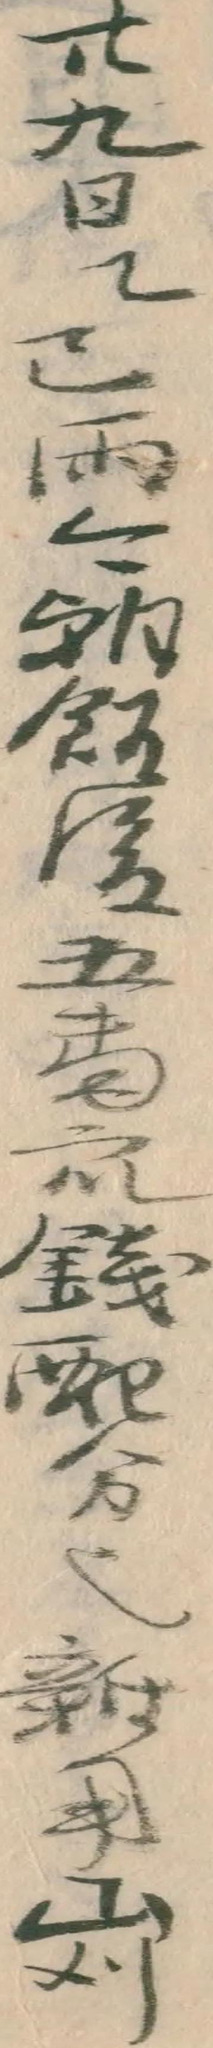廿九日乙巳雨今朝飯後五番衆銭配分也雑用山刈
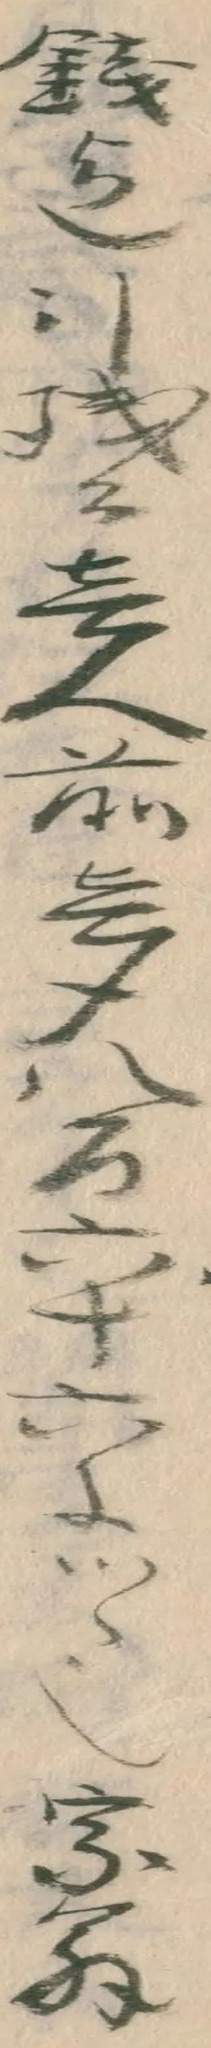銭迄引残而壱人前〆八百六十六匁ツヽ也家翁
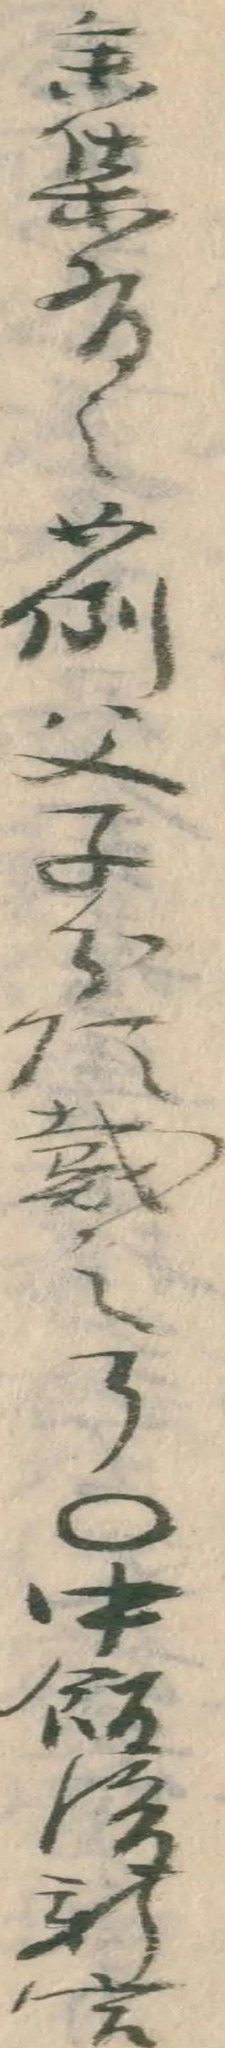参集有之如例父子分頂戴之了○中飯後新宮
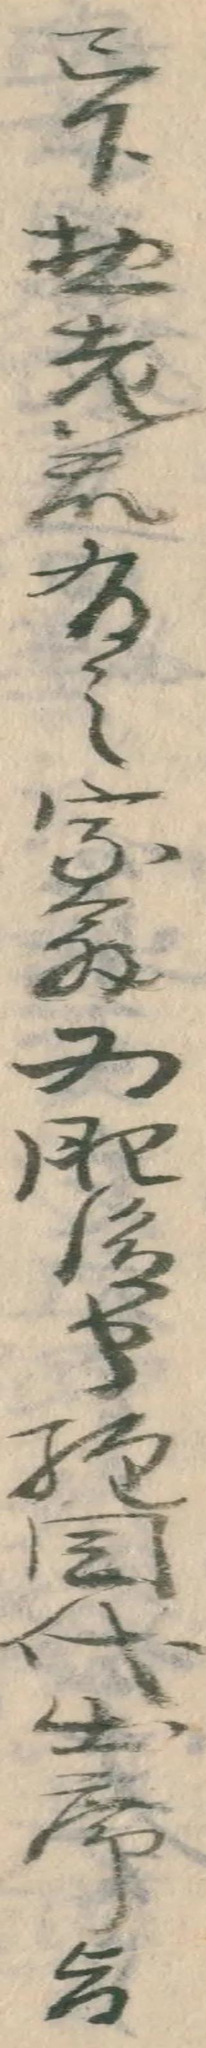已下惣老若有之家翁為肥後守経国代出席旨
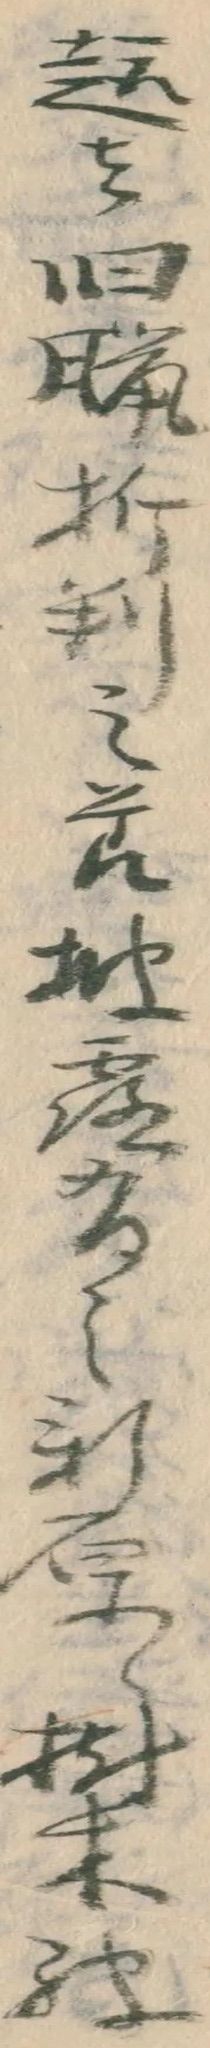趣者旧臘折判之節披露有之新原へ樹木彼
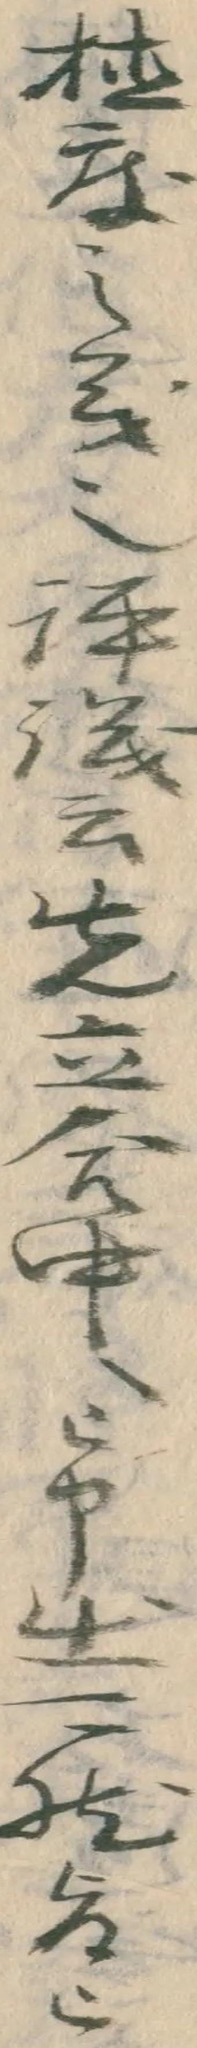植度之義也評議云先立會中へ被申出可然旨被
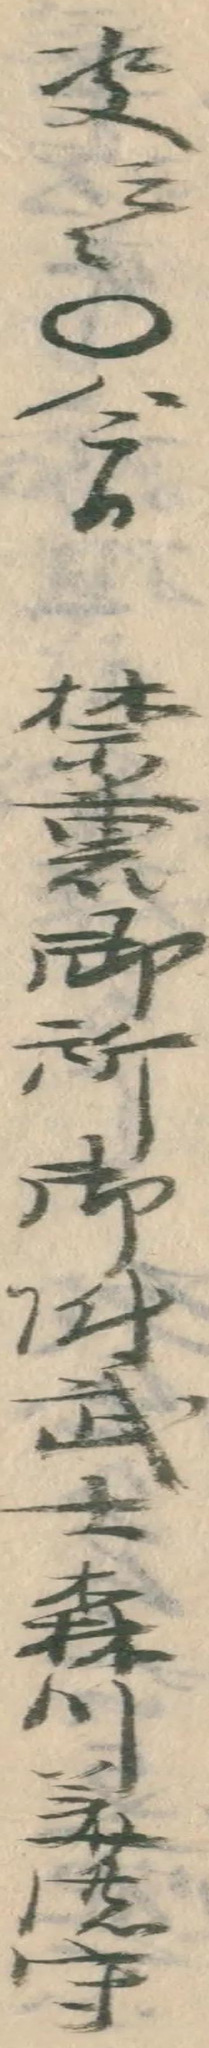決云々○今日禁裏御所御附武士森川美濃守
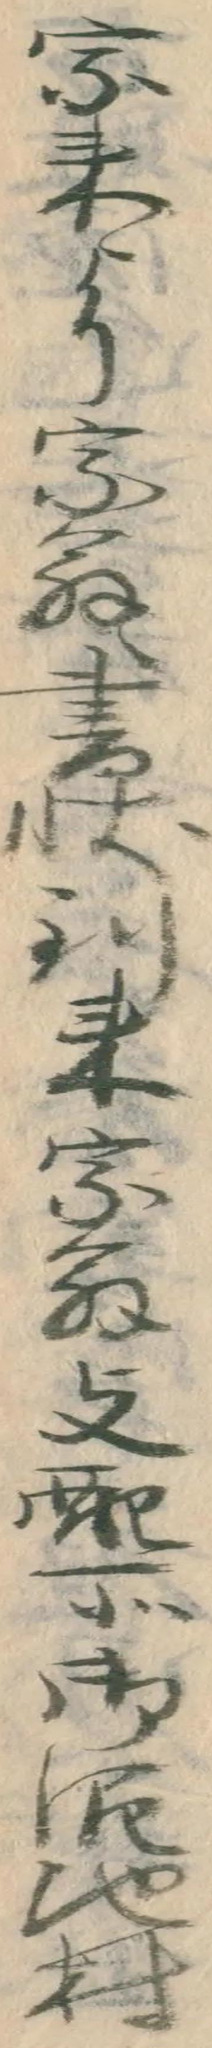家来より家翁へ書状到来家翁支配所御泥池村

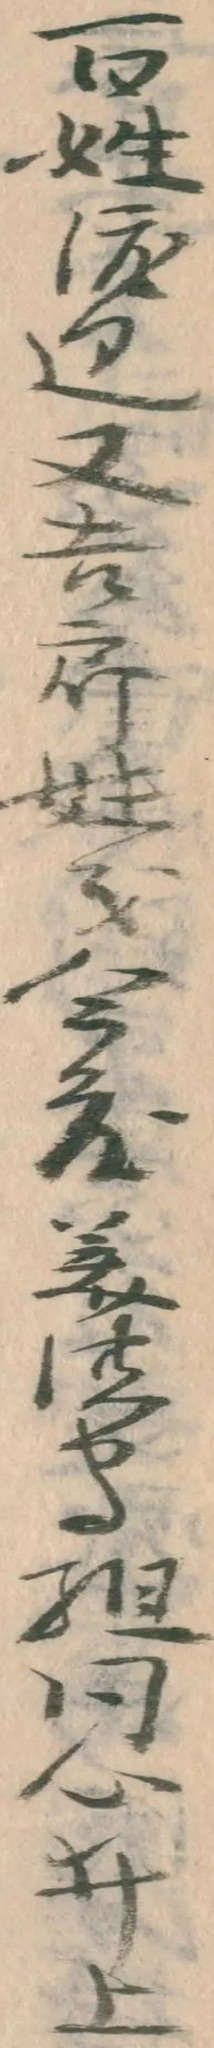百姓渡辺又吉郎姓義今度美濃守組同心井上
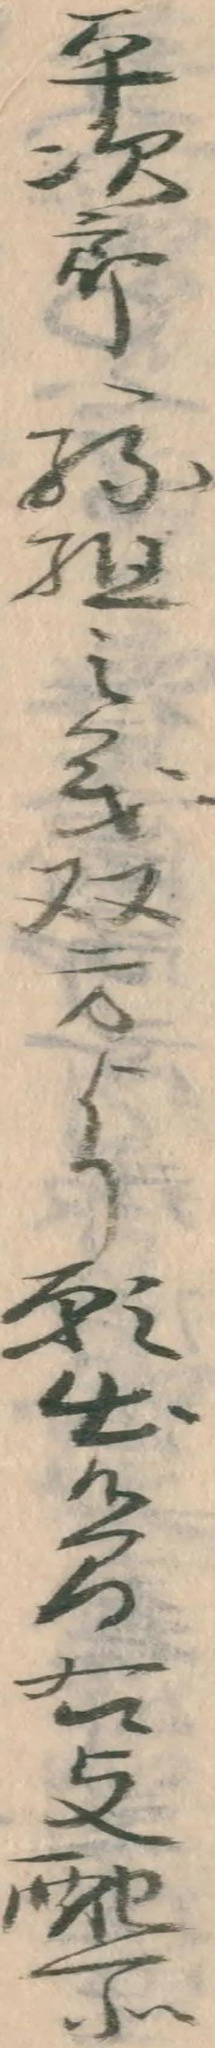平次郎へ駒組之義双方より願出候間右支配所
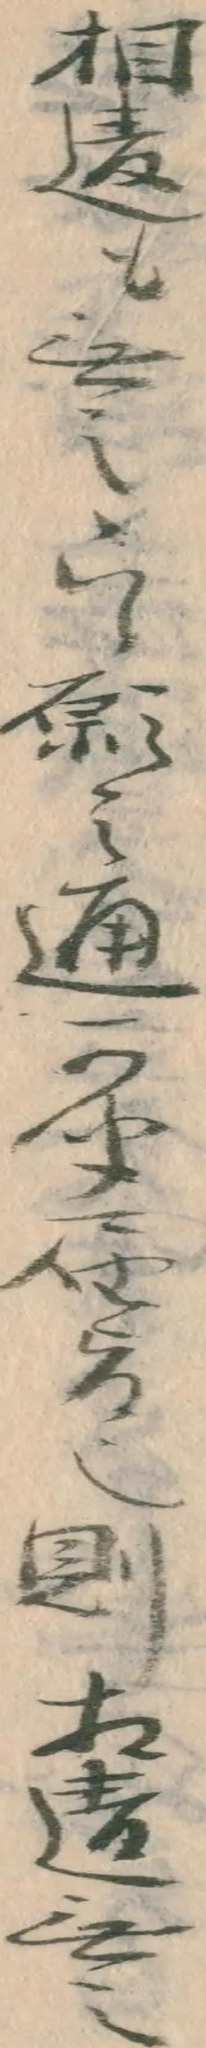相違も無之候はゝ願之通可聞届旨也則相違無之
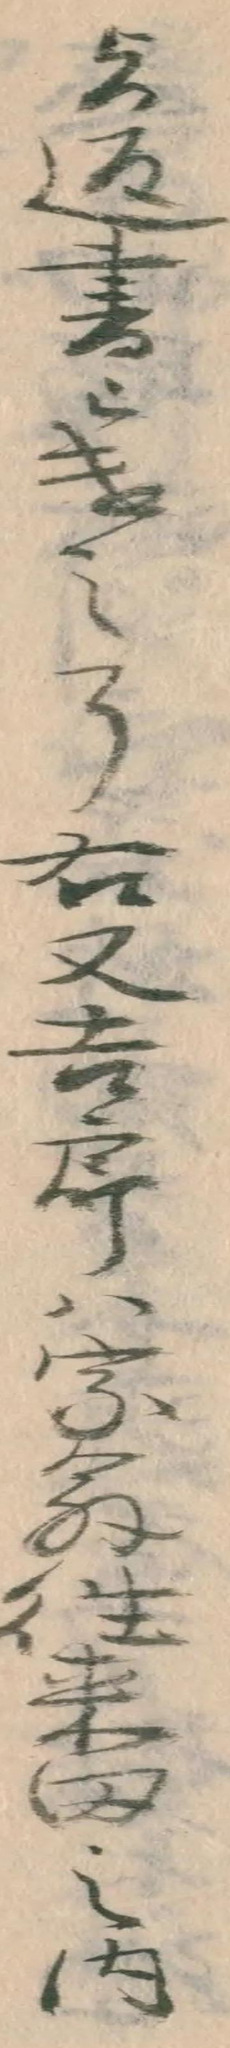旨返書被遣之了右又吉郎ハ家翁往来田之内
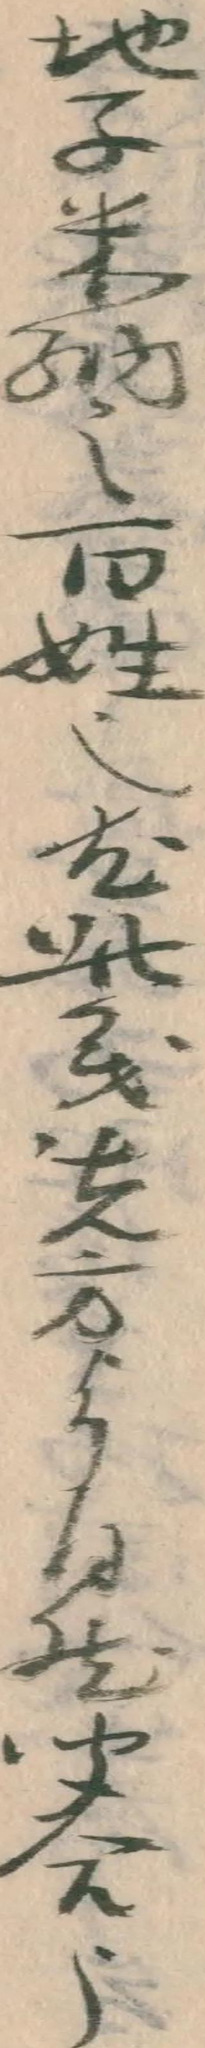地子米納之百姓也尤此義先方より自然聞合申
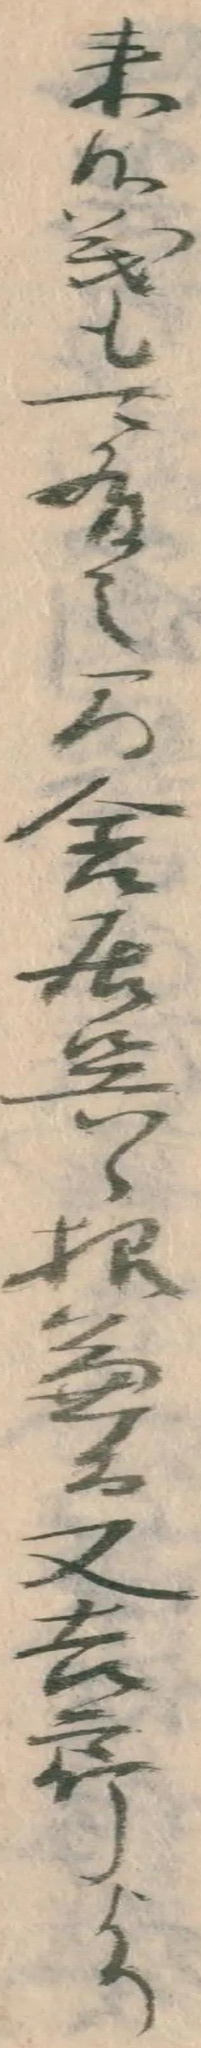来候義も可有之間舎居堅々様兼而又吉郎より
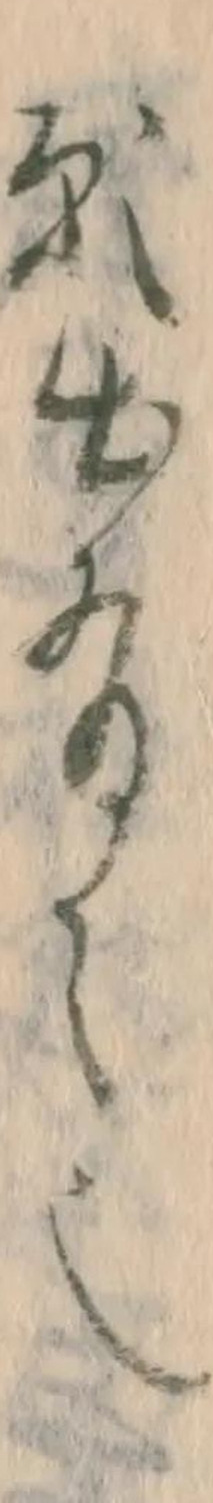願出有之也
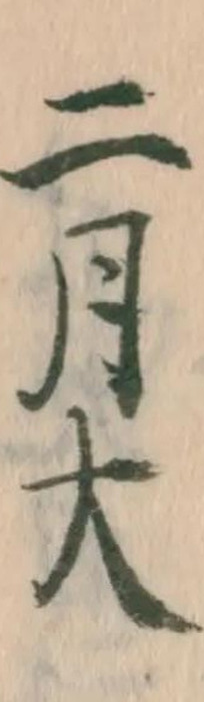二月大
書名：賀茂社記録. 第63冊
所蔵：国立国会図書館 National Diet Library, JAPAN
